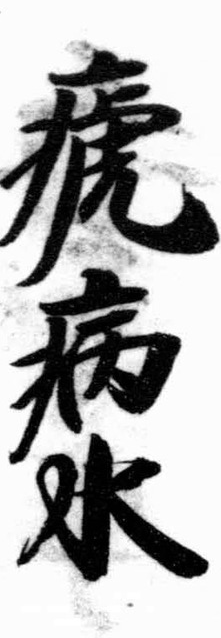瘧病水

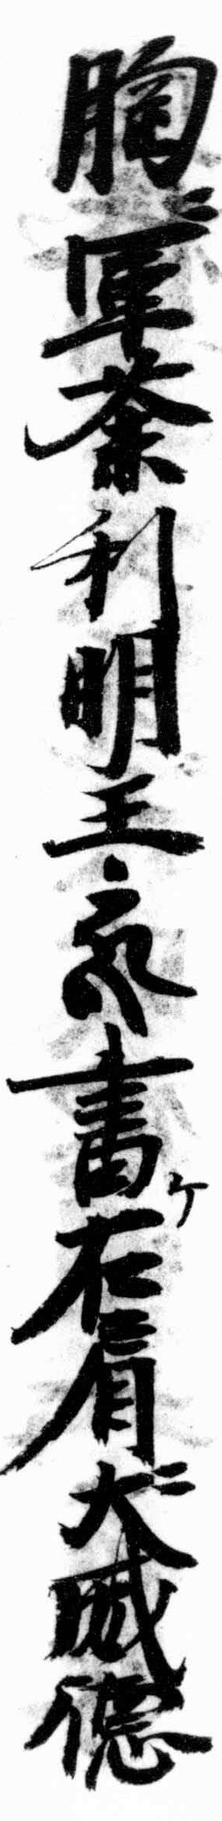胸軍荼利明王書右肩大威徳
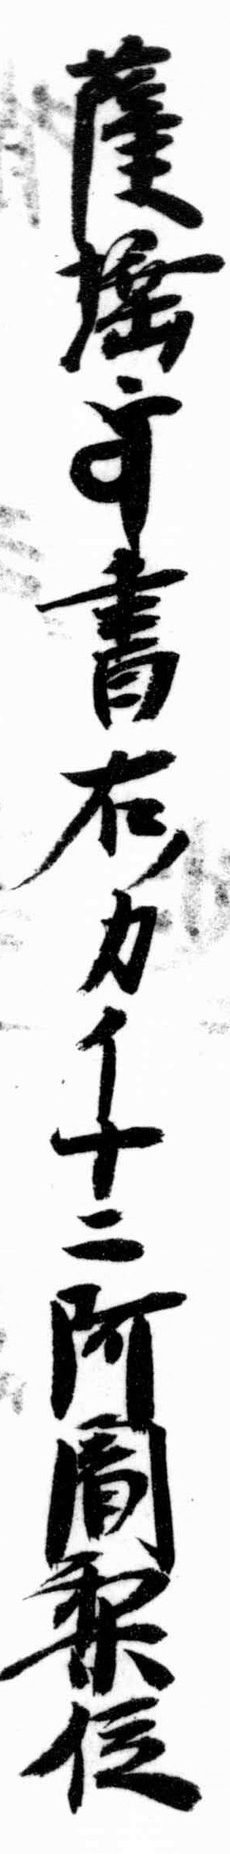薩埵書右カイナニ阿闍梨位
